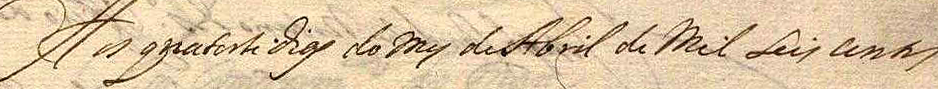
Aos quatorse dias do mes de Abril de mil seiscentos
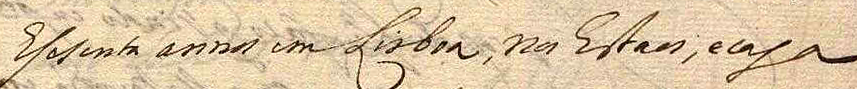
E sesenta annos em Lisboa, nos Estaos, e casa
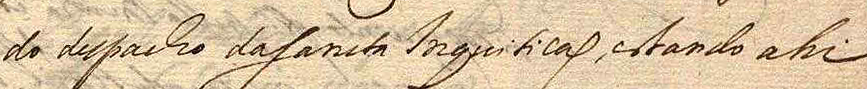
do despacho da Sancta Inquisiçaꝭ, estando ahi
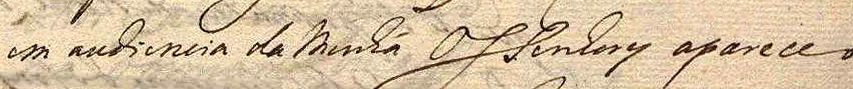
em audiencia da Menhã OS Senhores apareceo
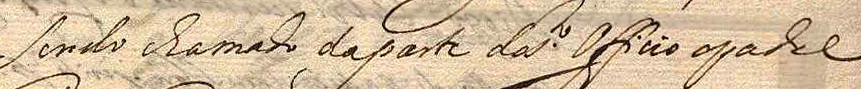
Sendo chamado da parte do s.to Officio o padre
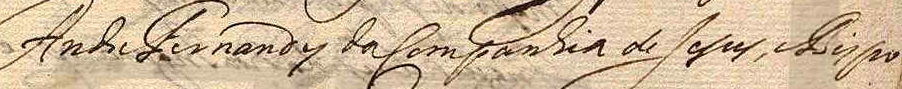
Andre Fernandes da Companhia de Jesus, e Bispo
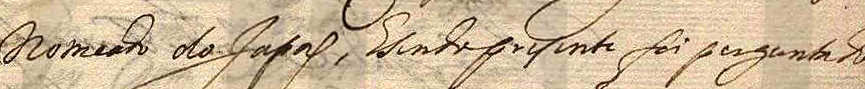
nomeado do Japaꝭ, E sendo presente foi perguntado
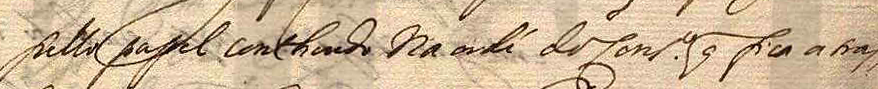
pello papel contheudo na ordē do Cons.o q̄ fica atras
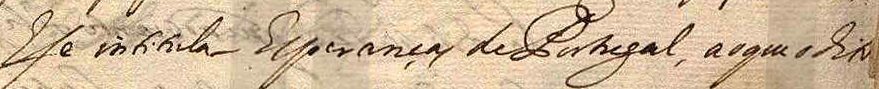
E se intitula Esperanças de Portugal, ao que o dito
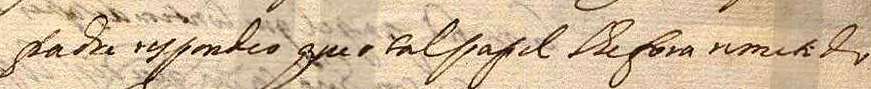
padre respondeo que o tal papel lhe fora remetido
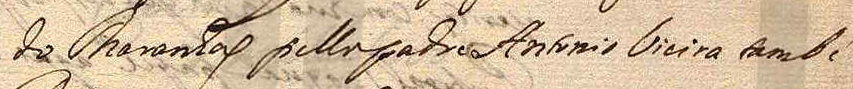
do Maranhaꝭ pello padre Antonio Vieira tambē
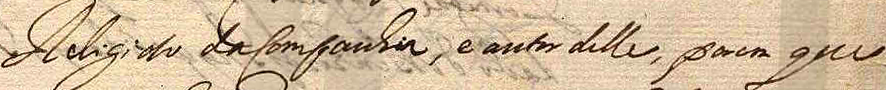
Religioso da Companhia, e autor delle, porem que
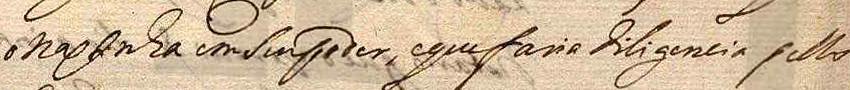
o naꝭ tinha em seu poder, e que faria diligencia pello
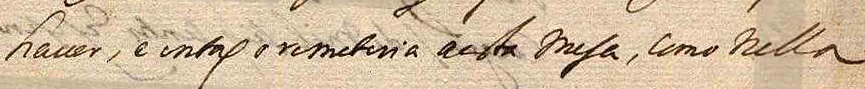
hauer, e então o remeteria a esta mesa, como nella
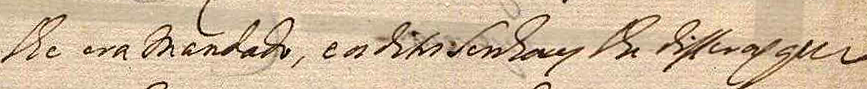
lhe era mandado, e os ditos Senhores lhe disseraꝭ que
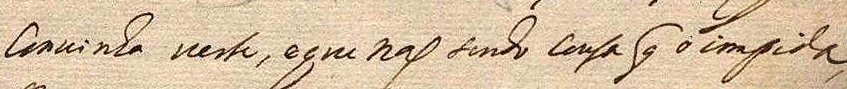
conuinha uerse, e que naꝭ tendo cousa q̄ o impida,
